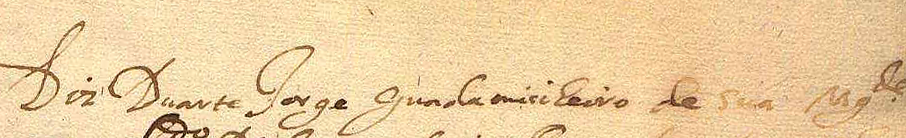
Diz Duarte Jorge guadamicileiro de sua Mg.de
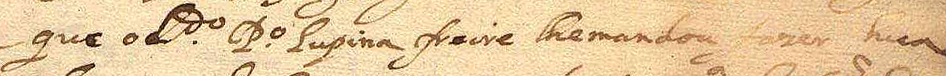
que o L.do P.o lupina freire lhe mandou fazer hua
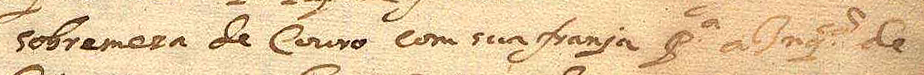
sobremeza de Couro com sua franja p.a a Inq.çaõ de
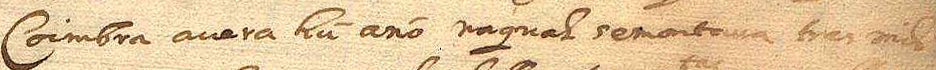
Coimbra auera hū anō na qual se montaua tres mil
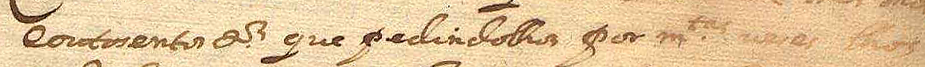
e outosentos r.s que pedindolhos por m.tas ueses lhos
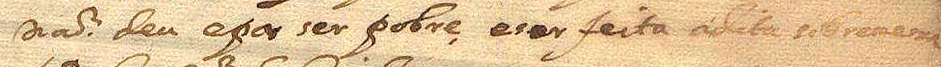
naõ deu e por ser pobre, e ser feita a dita sobremeza
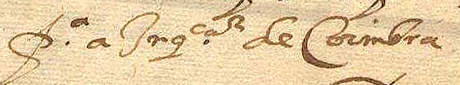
p.a a Inq.çā de Coimbra
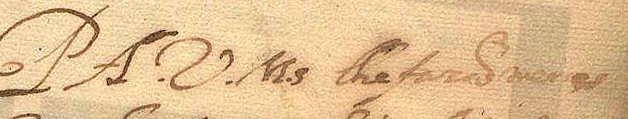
P A .V. M.s lhe faraõ merces
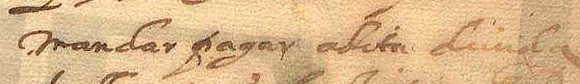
mandar pagar a dita diuida
